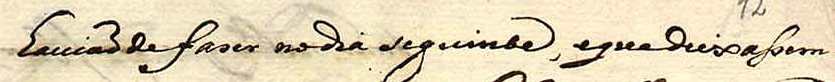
hauiaõ de faser no dia seguinte, e que deixassem
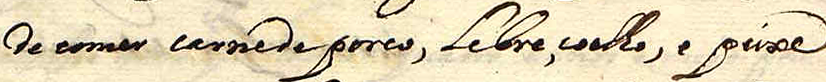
de comer carne de porco, Lebre, coelho, e peixe
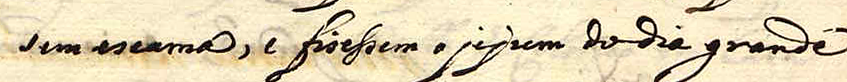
sem escama, e fisessem o jejum do dia grande
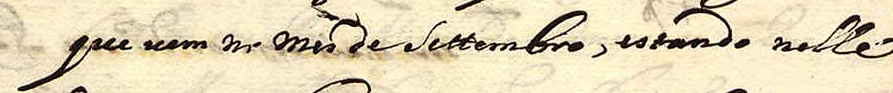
que uem no mes de Settembro, estando nelle
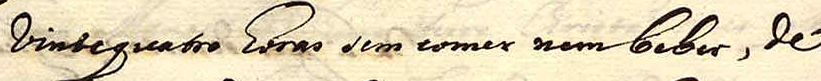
vinte quatro horas sem comer nem beber, de
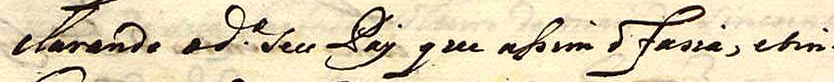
clarando o d.o seu Pay que assim o fasia, e tin
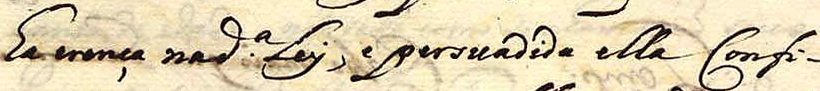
ha crença na d.a Ley, e persuadida ella Confi
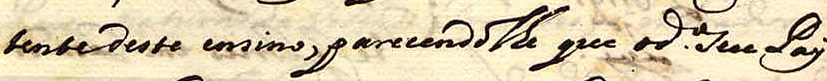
tente deste ensino, parecendolhe que o d.o seu Pay
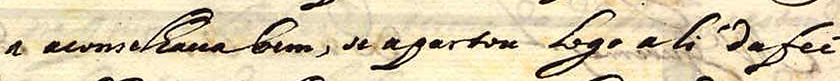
a aconselhaua bem, se apartou logo ali da feé
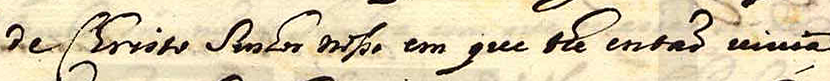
de Christo Senhor nosso em que the entaõ uiuia,
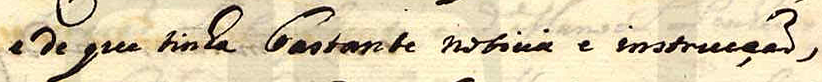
e de que tinha bastante noticia e instrucçaõ,
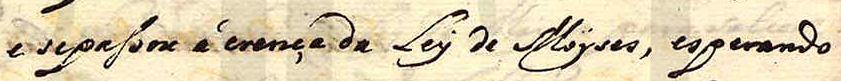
e se passou á crença da Ley de Moyses, esperando
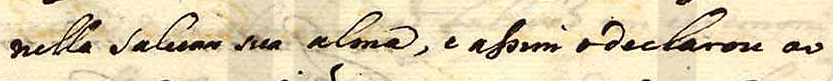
nella saluar sua alma, e assim o declarou ao
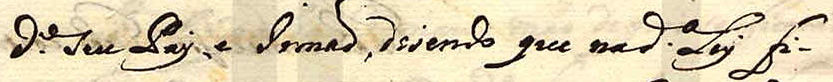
d.o seu Pay, e Irmaõ, disendo que na d.a Ley fi
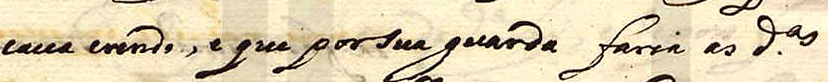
caua crendo, e que por sua guarda faria as d.as
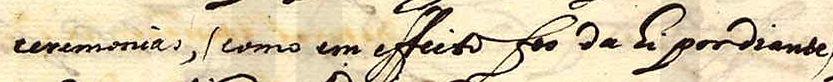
ceremonias, (como em effeito fes dahi por diante)
